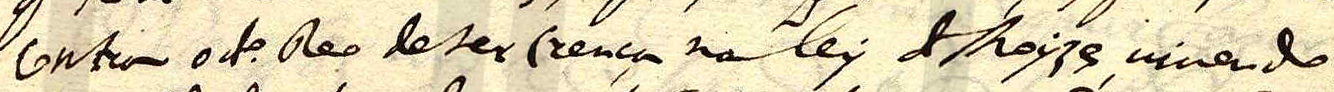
contra o d̄.o Reo de ter Crença na ley de Moyzes uiuendo
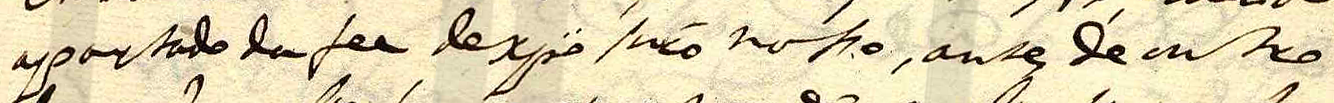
apartado da fee de xpō snrō nosso, antes de outro
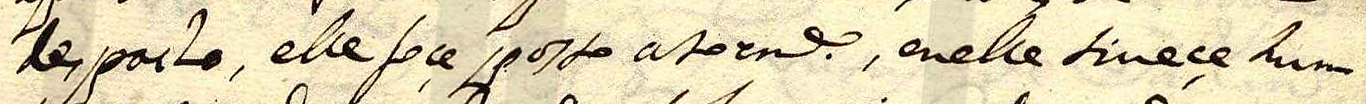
despacho, elle foçe posto a torm.to, e nelle tiueçe hum
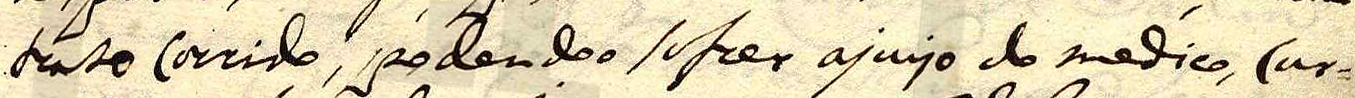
trato Corrido, podendoo sofrer a juiso do medico, Cur
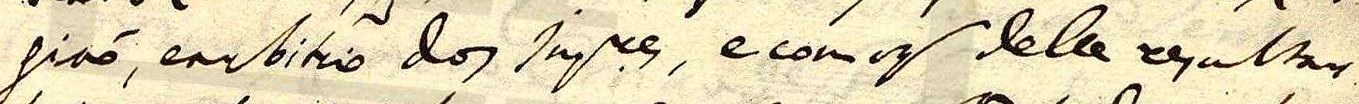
giaõ, e arbitrio dos Inq.res, e com o q̄ delle resultar
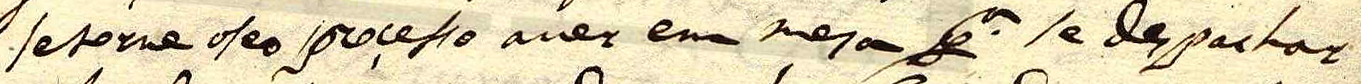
se torne o seo processo a uer em mesa p.a se despachar
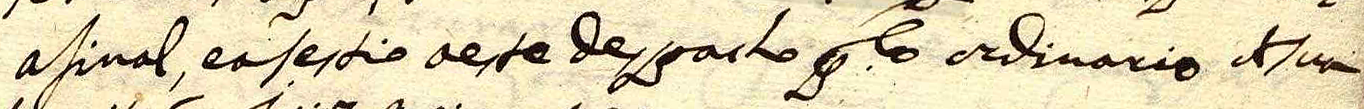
afinal, e asestio a este despacho p.lo ordinario d̄ sua
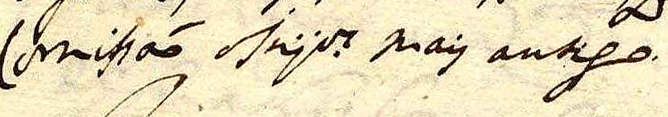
Comissaõ o Inq.or mais antigo.
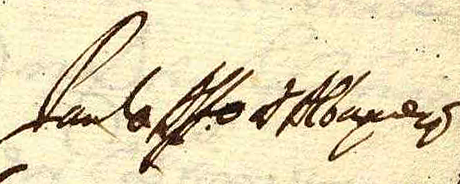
Paulo Aff.o d̄ Albuquerq̄
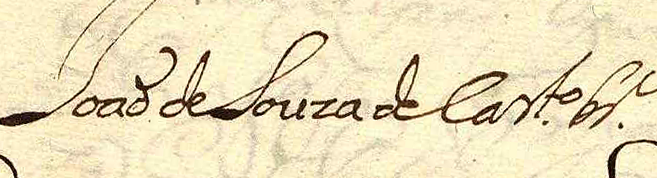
Joaõ de Souza de Cast.o br.co
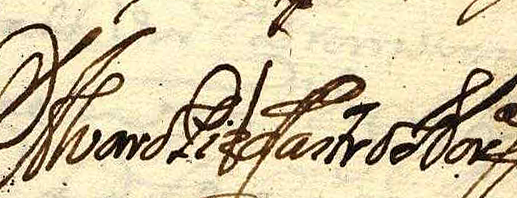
Alvaro Piz̄ d̄ Castro Nora
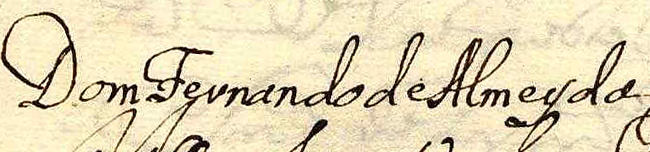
Dom Fernando de Almeyda
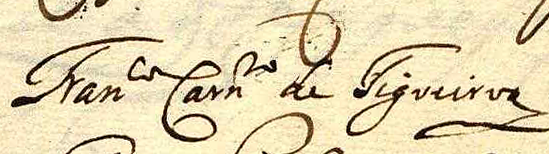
Franco Carnro de Figueiroa
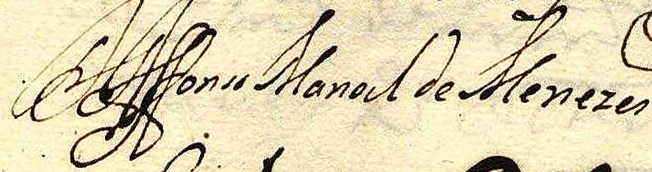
D Affonso Manoel de Menezes
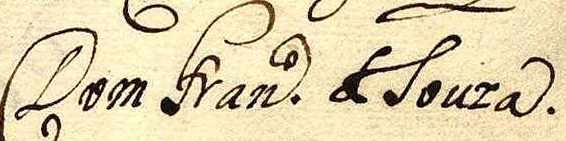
Dom Fran.co d̄ Souza.
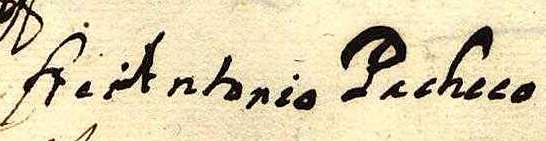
frei Antonio Pacheco
